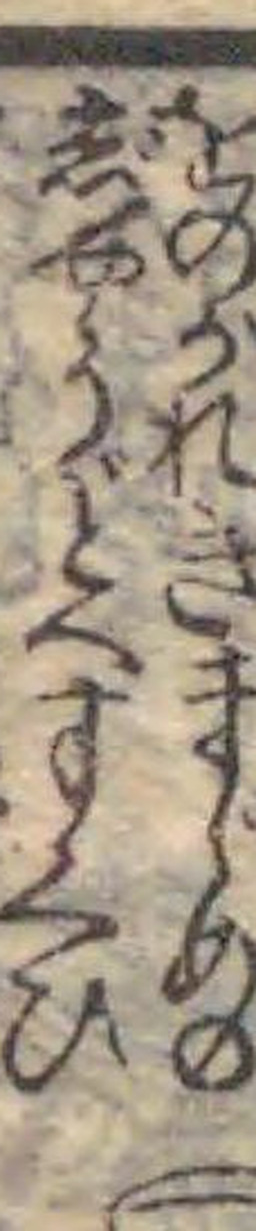じやうどへすくひ
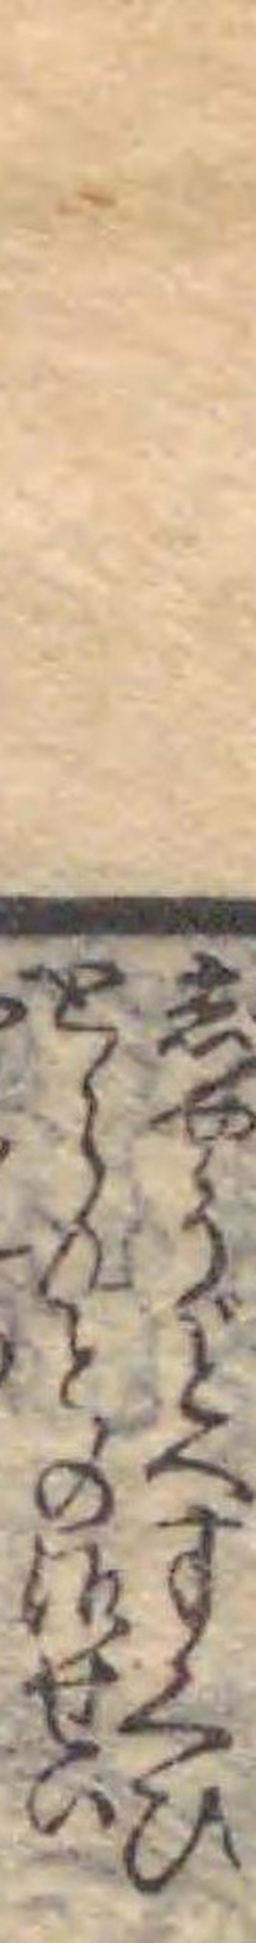とらんとの御せい
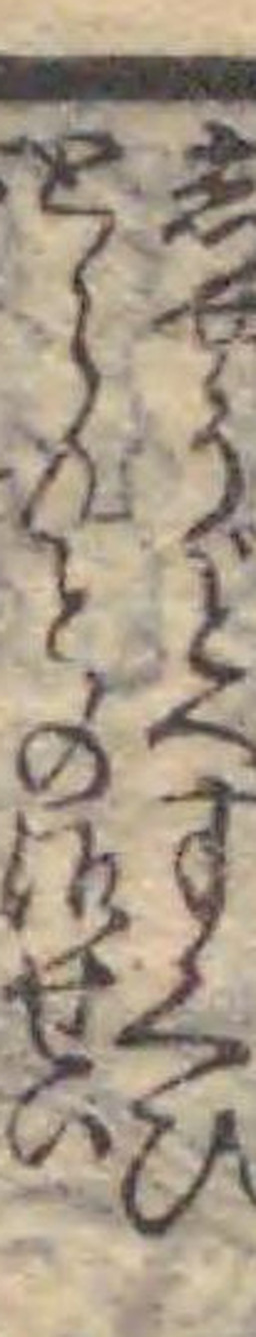とらんとの御せい
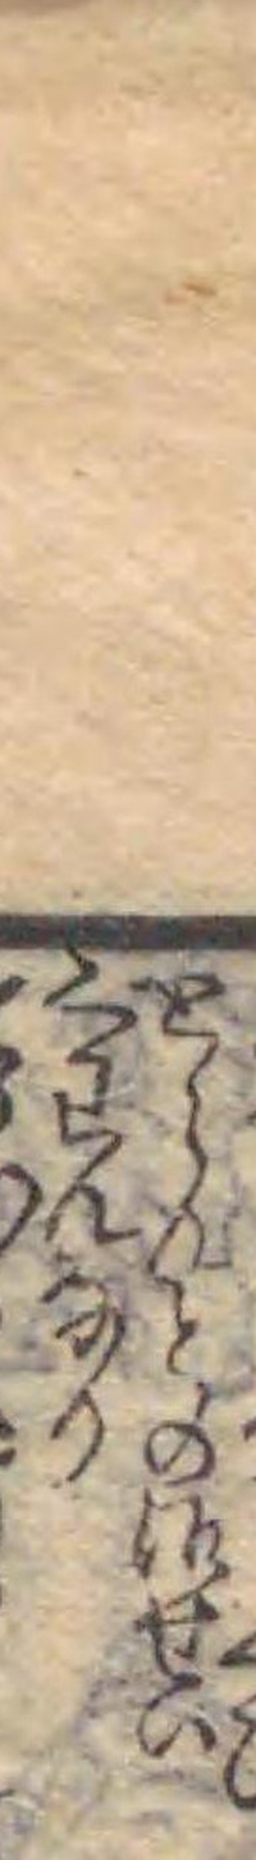ぐわんなり
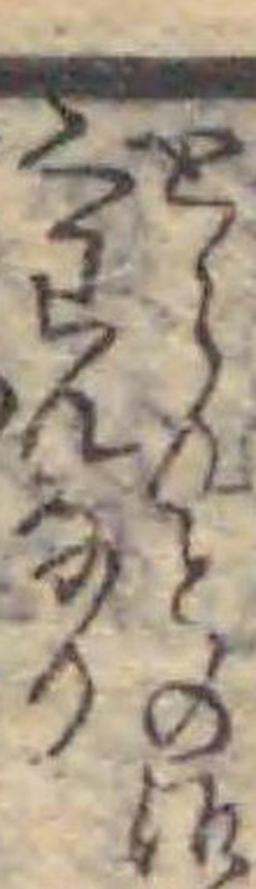ぐわんなり
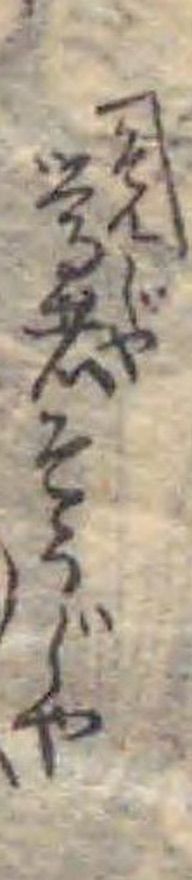尊者そうじや
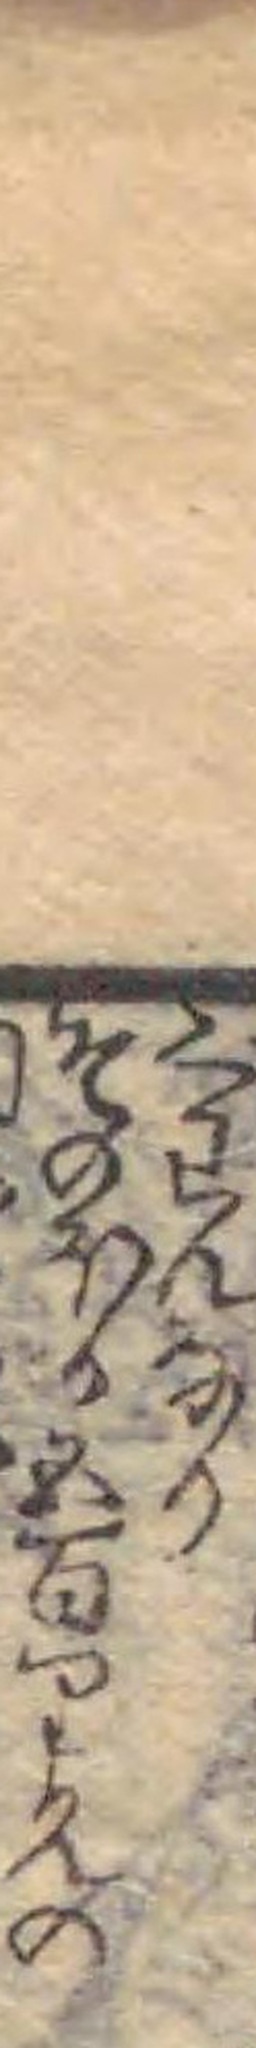そのほか五百りかんの
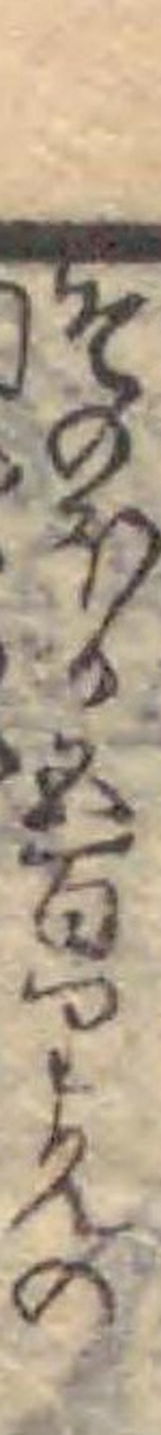そのほか五百りかんの
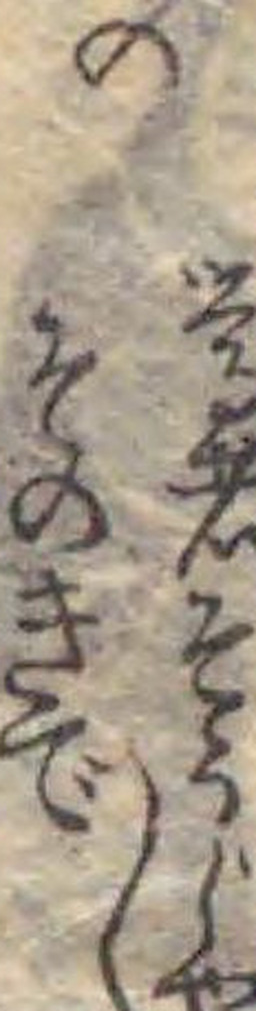そのきで
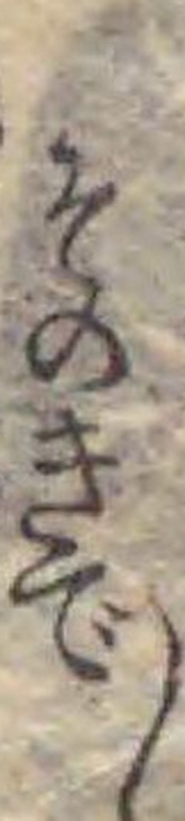そのきで
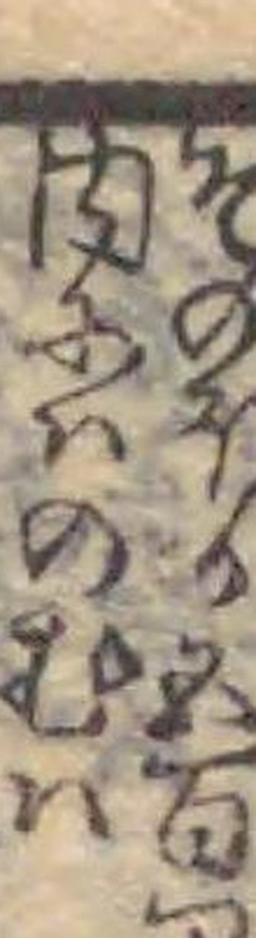内にはのむは
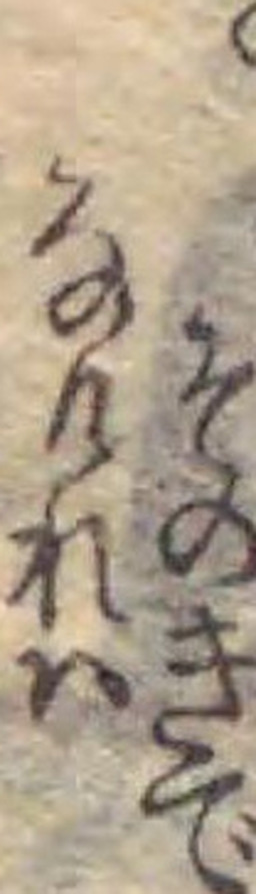なけれは
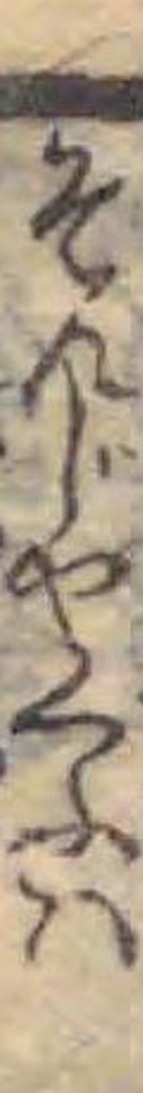そんじやくふは
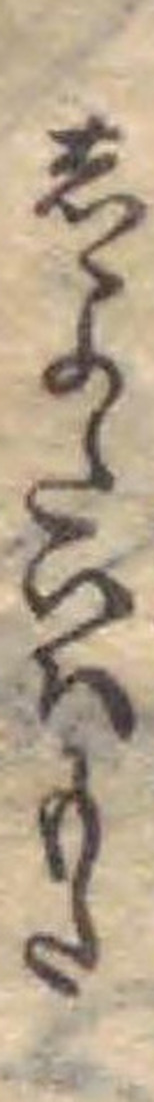しよたいはもた
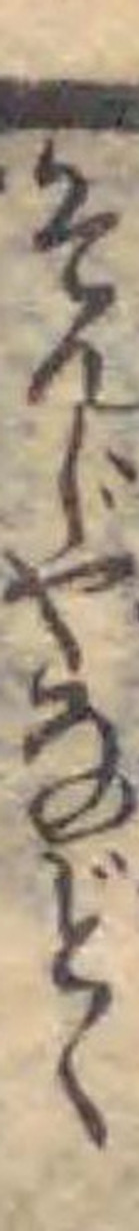そんじやなどゝ
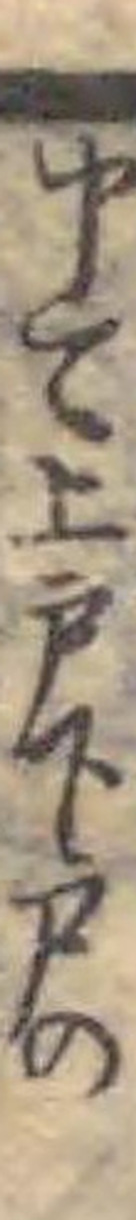申て上戸下戸の
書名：身体開帳略縁起 : 3巻
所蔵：国立国会図書館 National Diet Library, JAPAN
